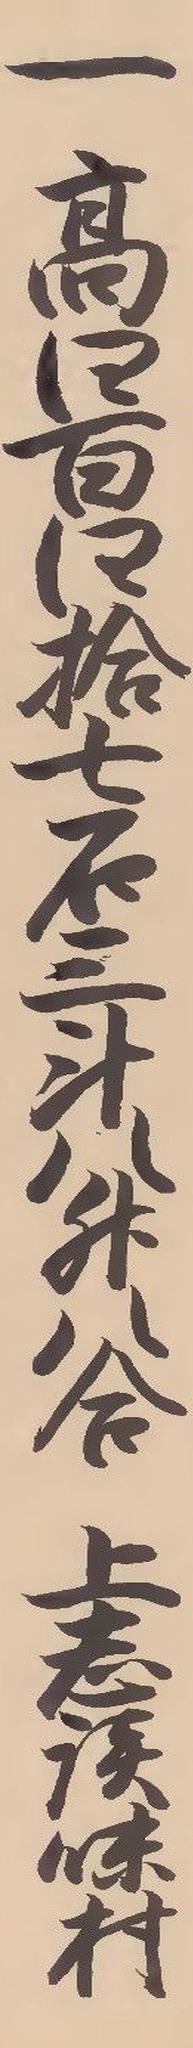一高四百四拾七石三斗八升八合上志談味村
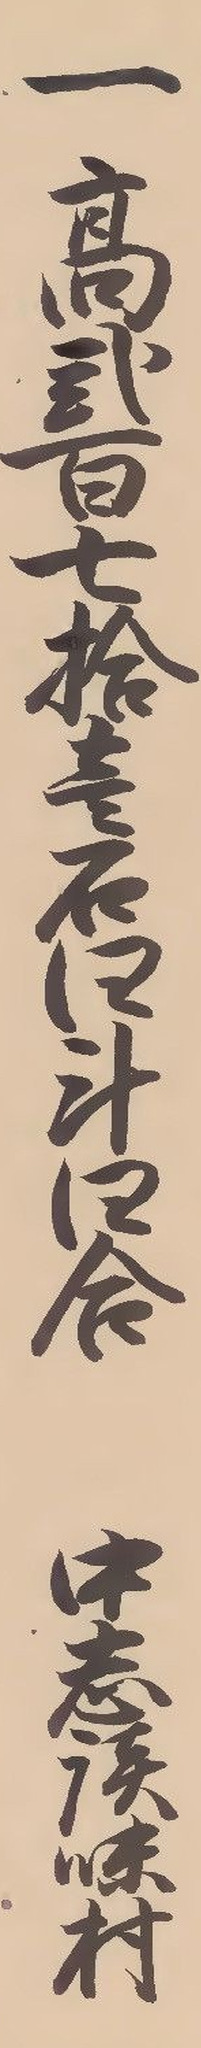一高弐百七拾壱石四斗四合中志談味村
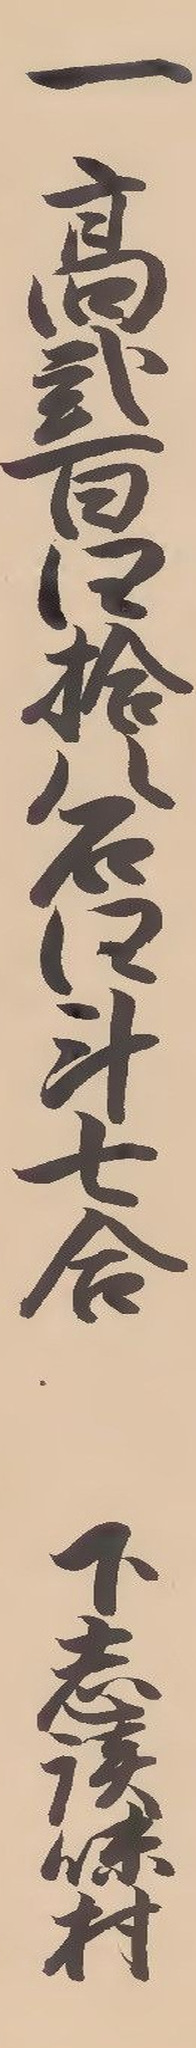一高弐百四拾八石四斗七合下志談味村
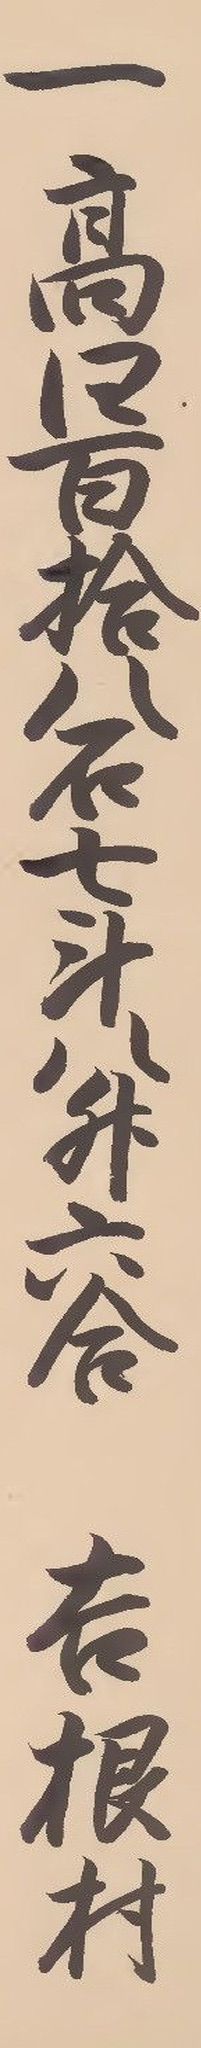一高四百拾八石七斗八升六合吉根村
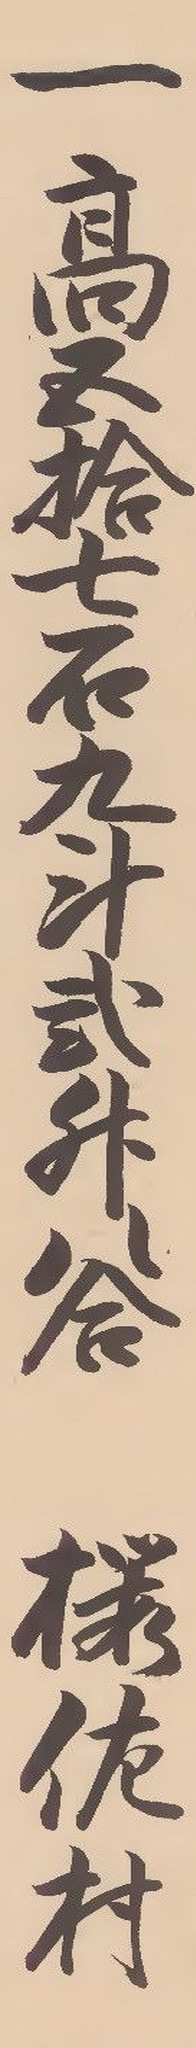一高五拾七石九斗弐升八合桜佐村
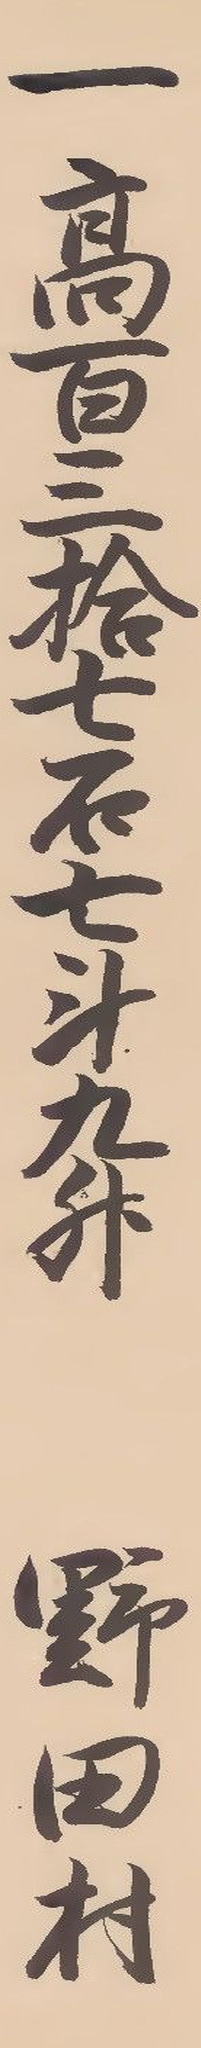一高百三拾七石七斗九升野田村
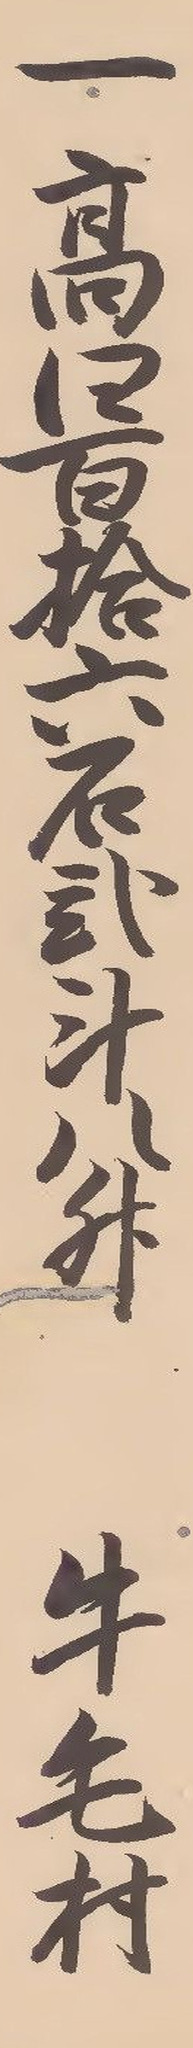一高四百拾六石弐斗八升牛毛村

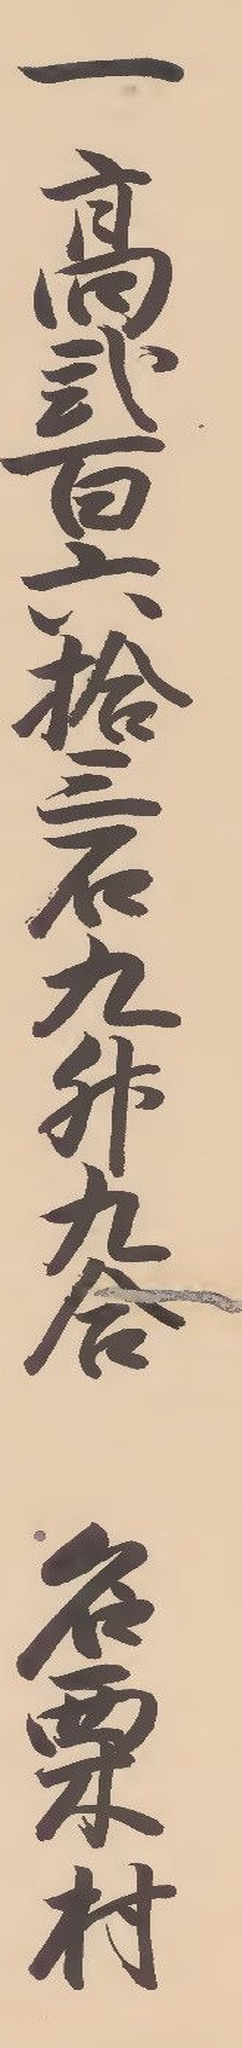一高弐百六拾三石九升九合名栗村
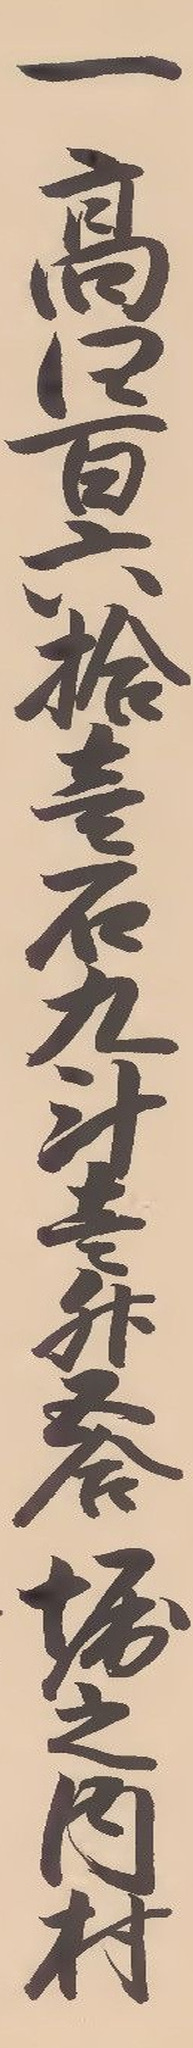一高四百六拾壱石九斗壱升五合堀之内村
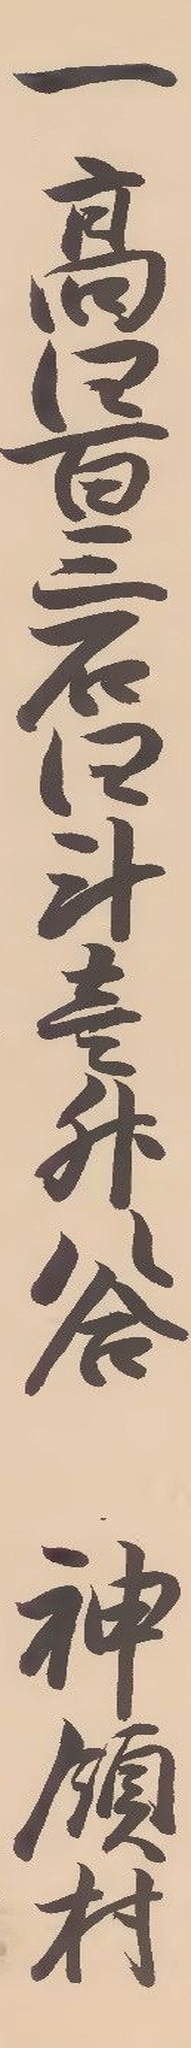一高四百三石四斗壱升八合神領村
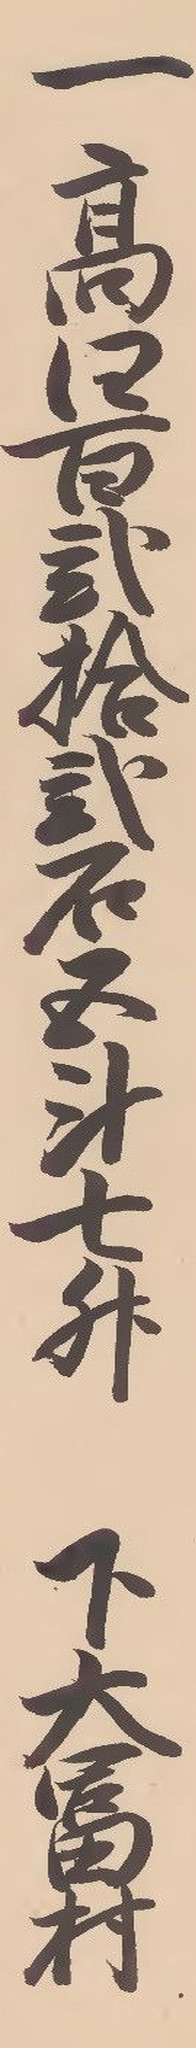一高四百弐拾弐石五斗七升下大富村
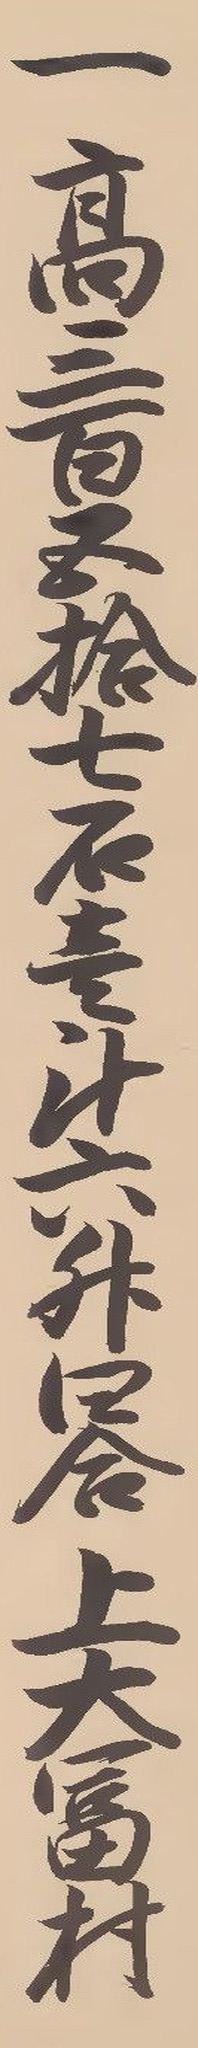一高三百五拾七石壱斗六升四合上大富村
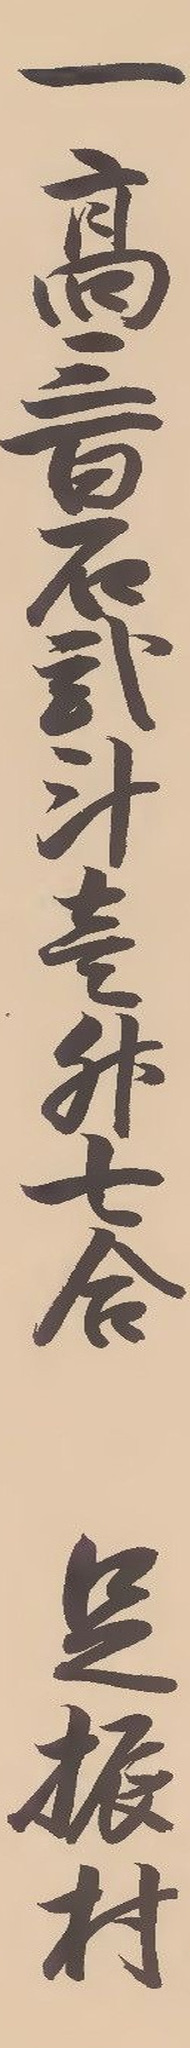一高三百石弐斗壱升七合足振村
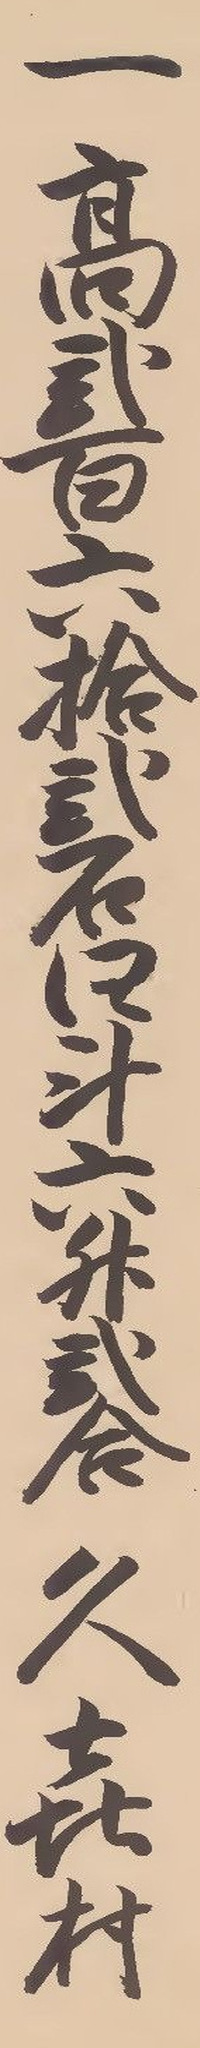一高弐百六拾弐石四斗六升弐合久喜村
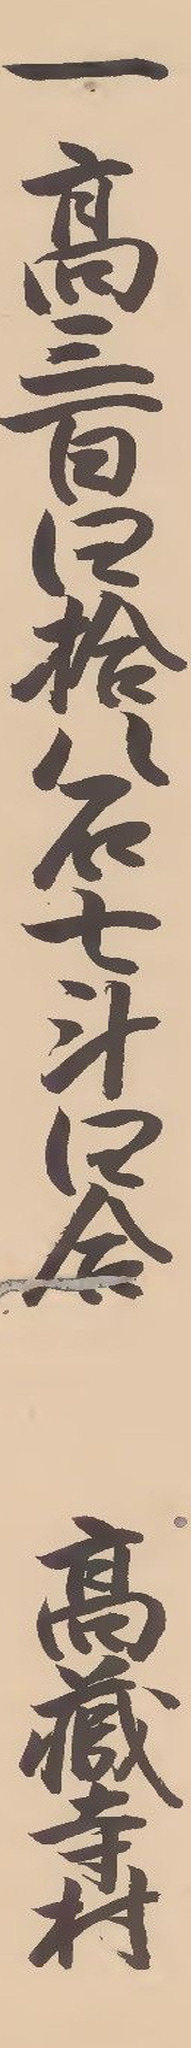一高三百四拾八石七斗四合高蔵寺村

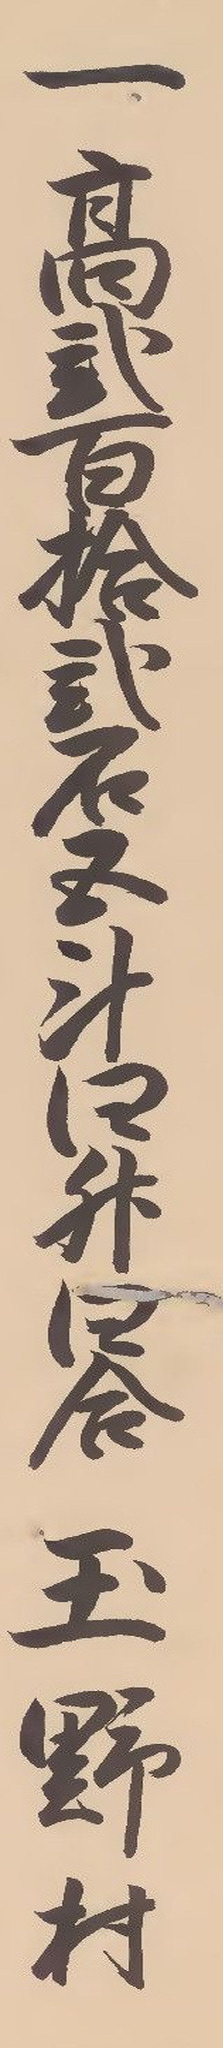一高弐百拾弐石五斗四升四合玉野村
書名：尾張国郷帳
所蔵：国立公文書館 National Archives of Japan
